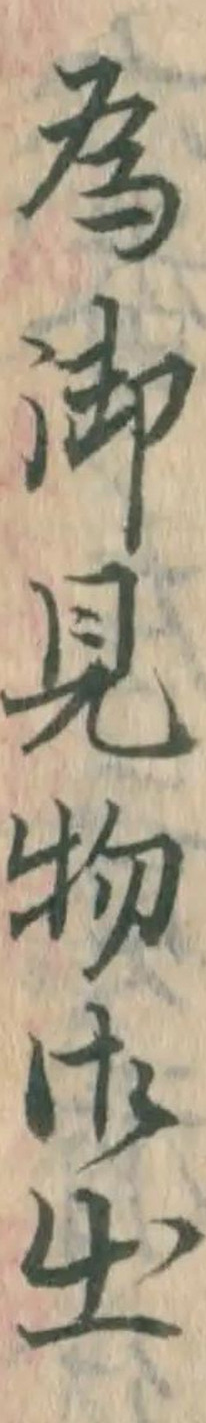為御見物御出

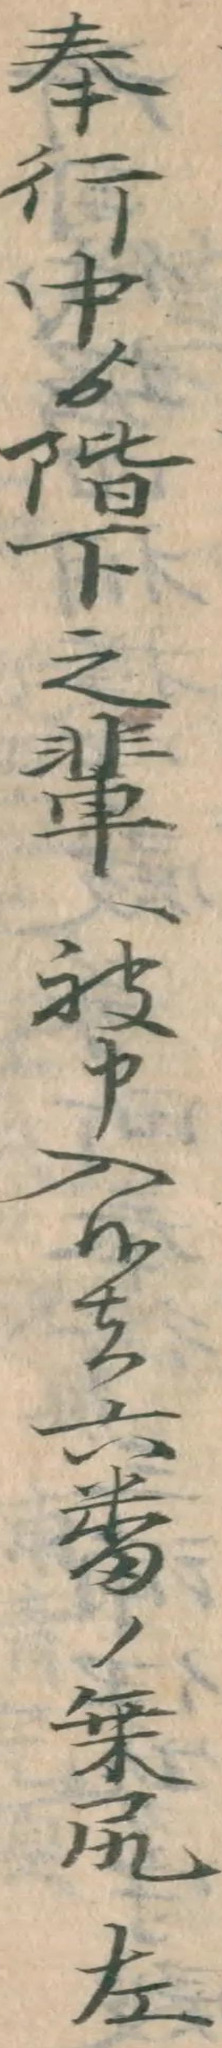奉行中ゟ階下之輩へ被申入候者六番ノ乗尻左
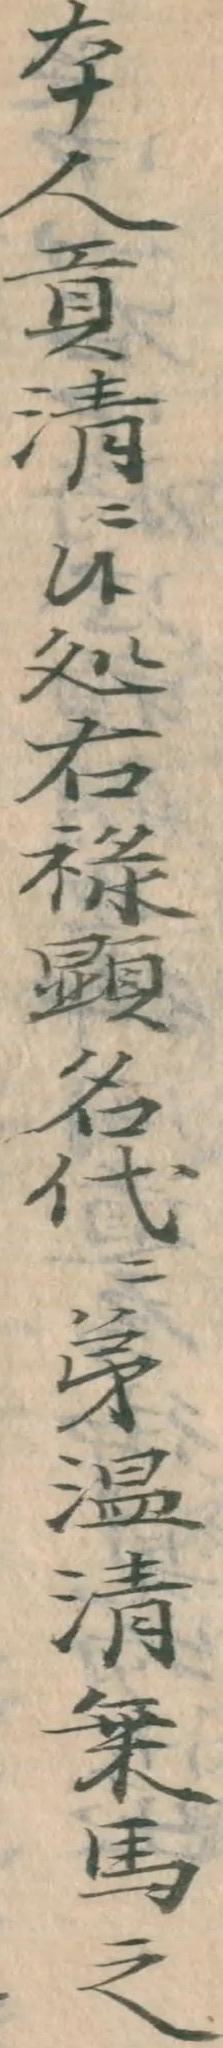本人貢清ニ候処右禄顕名代ニ弟温清乗馬之
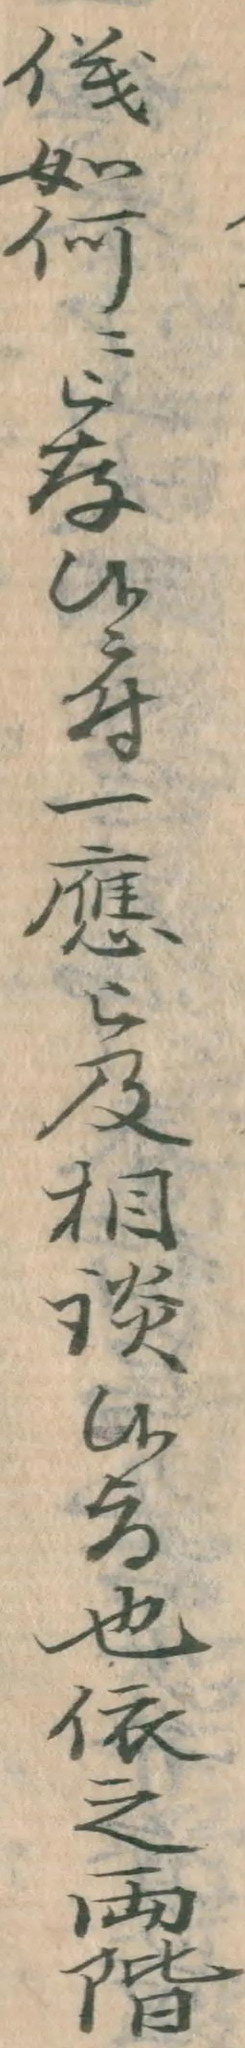儀如何ニ被存候ニ付一応被及相談候旨也依之両階
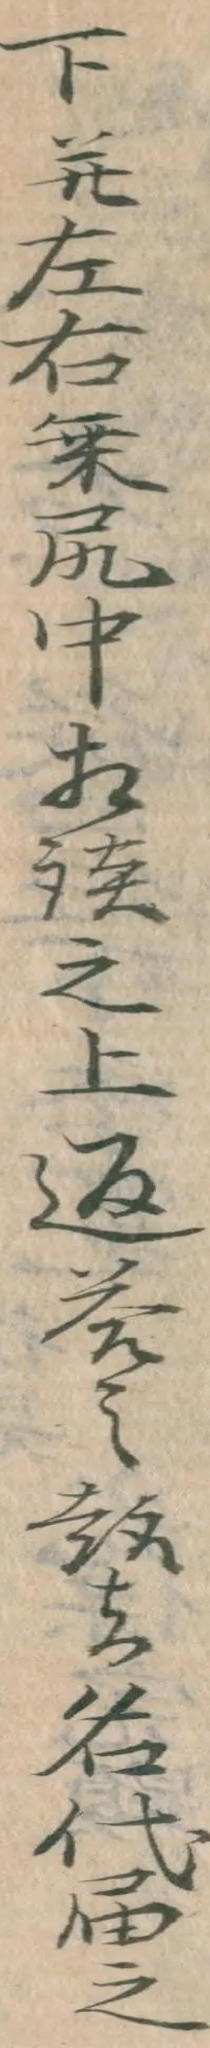下并左右乗尻中相談之上返答之趣者名代届之
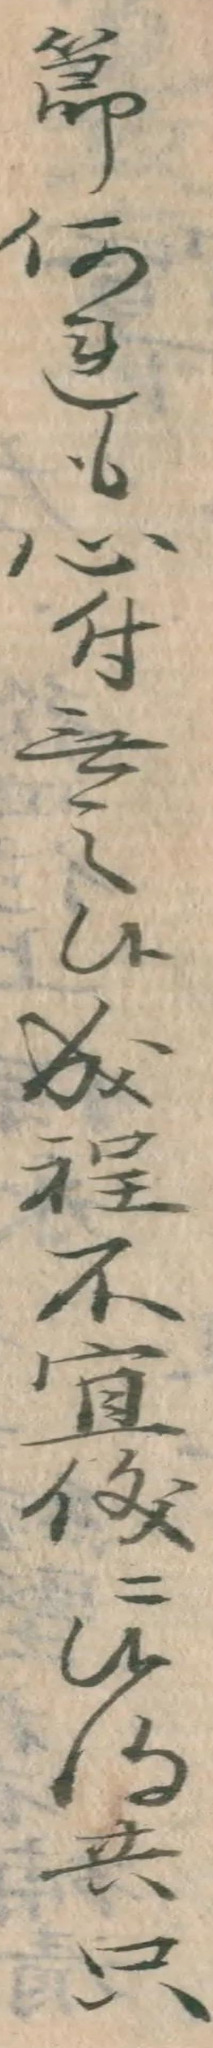節何れも心付無之候成程不宜儀ニ候得共只
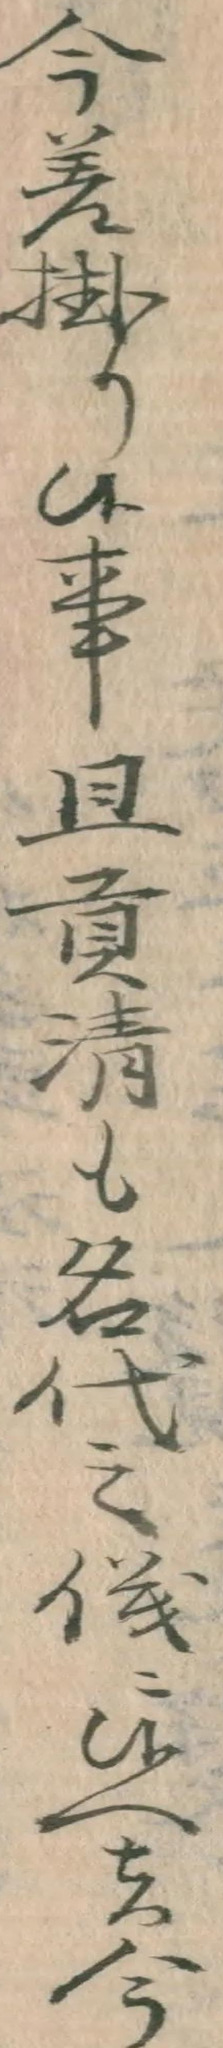今差掛リ候事且貢清も名代之儀ニ候へ者今
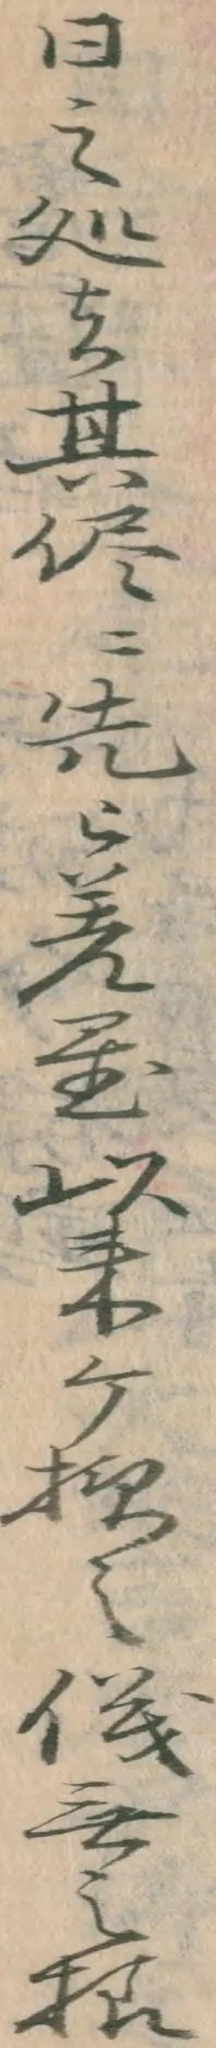日之処者其侭ニ先御差置以来ケ様之儀無之様
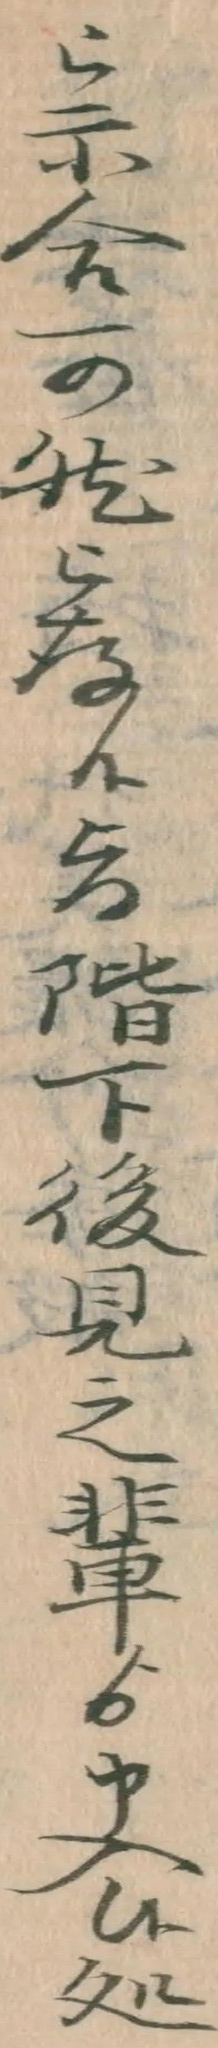被示合可然被存候旨階下後見之輩ゟ申入候処
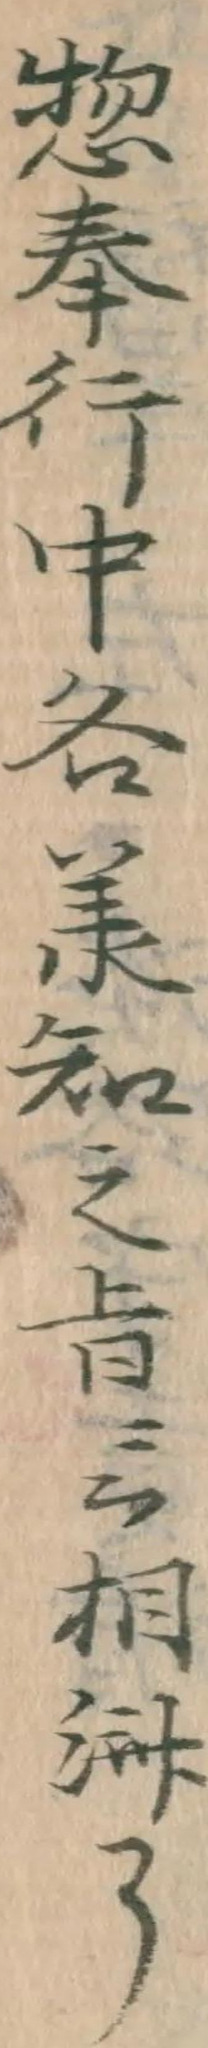惣奉行中各承知之旨ニ而相済了
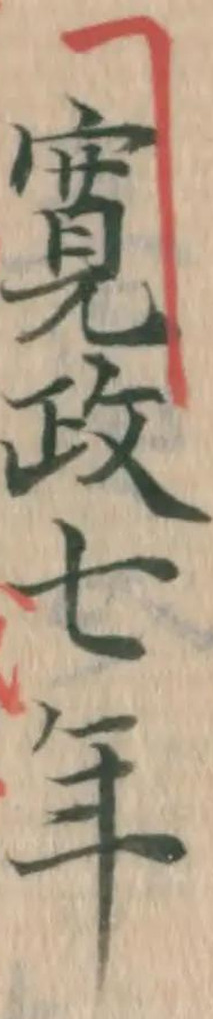寛政七年
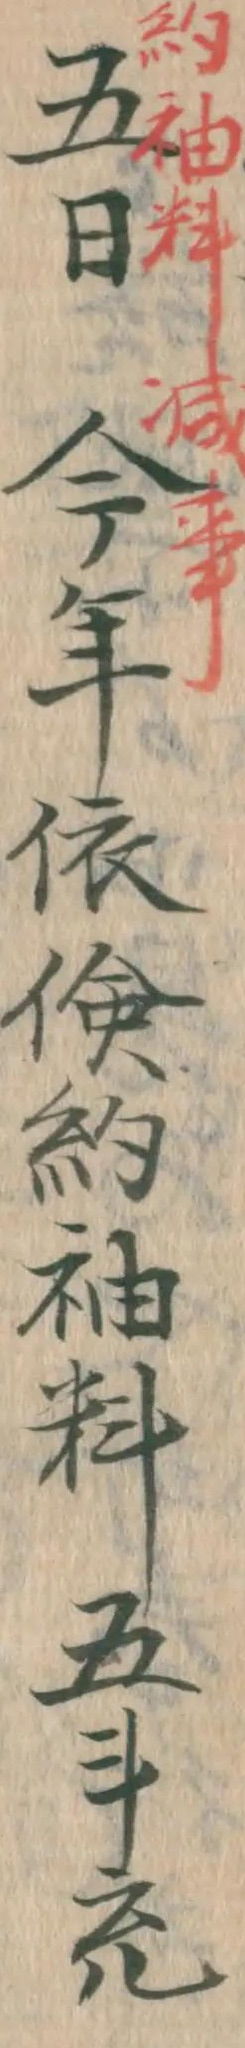五日今年依倹約袖料五斗充
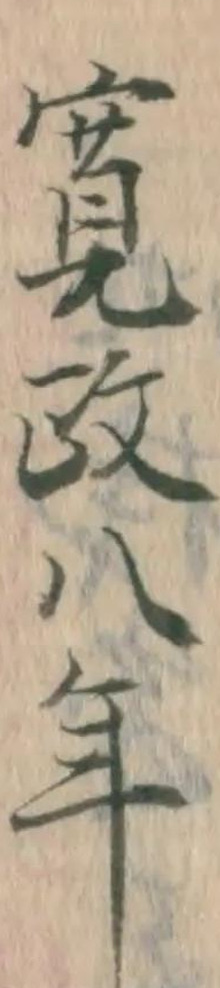寛政八年
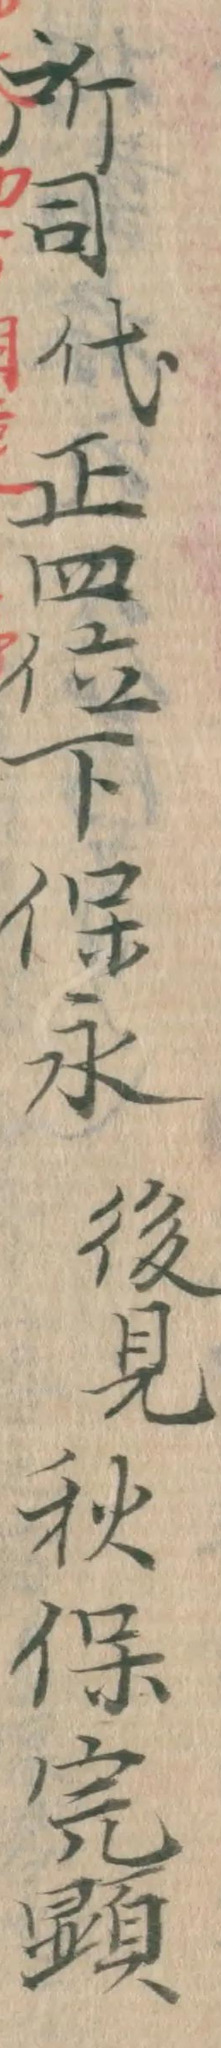所司代正四位下保永後見秋保完顕
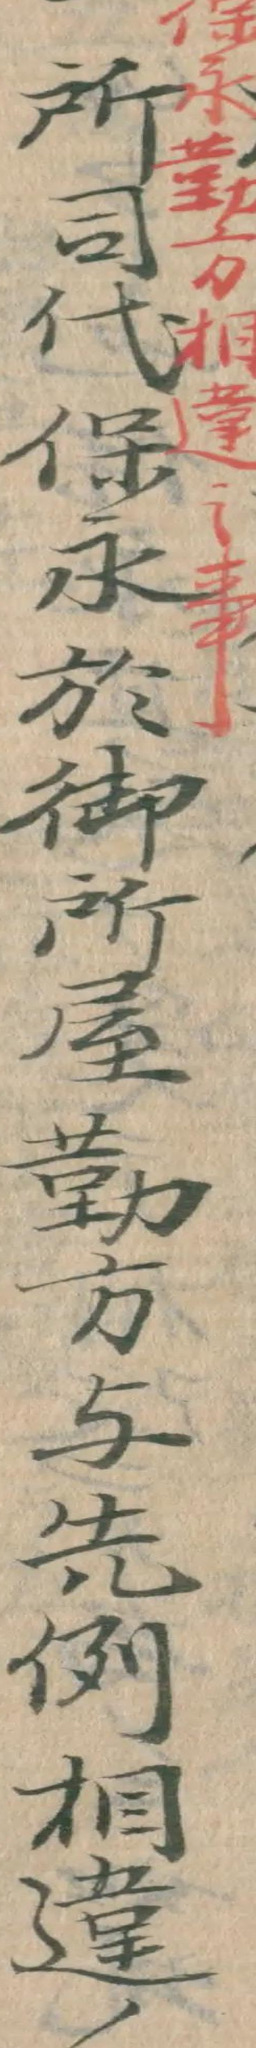一所司代保永於御所屋勤方与先例相違ノ
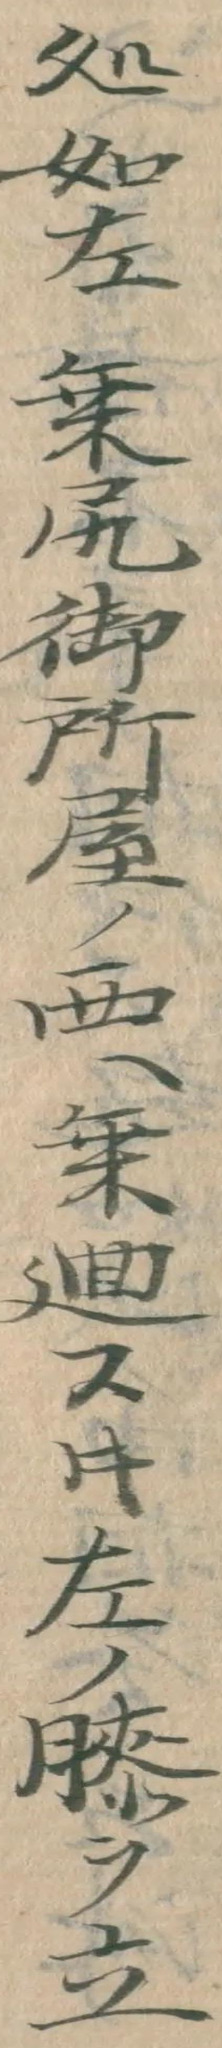処如左乗尻御所屋ノ西ヘ乗廻ストキ左ノ膝ヲ立
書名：賀茂社記録. 第10冊
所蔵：国立国会図書館 National Diet Library, JAPAN
